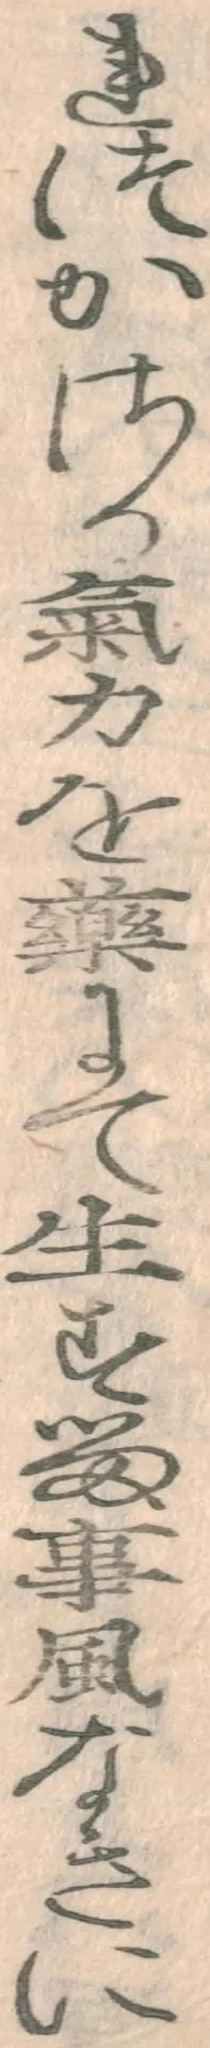れつかさる気力を薬にて生する事風なきに
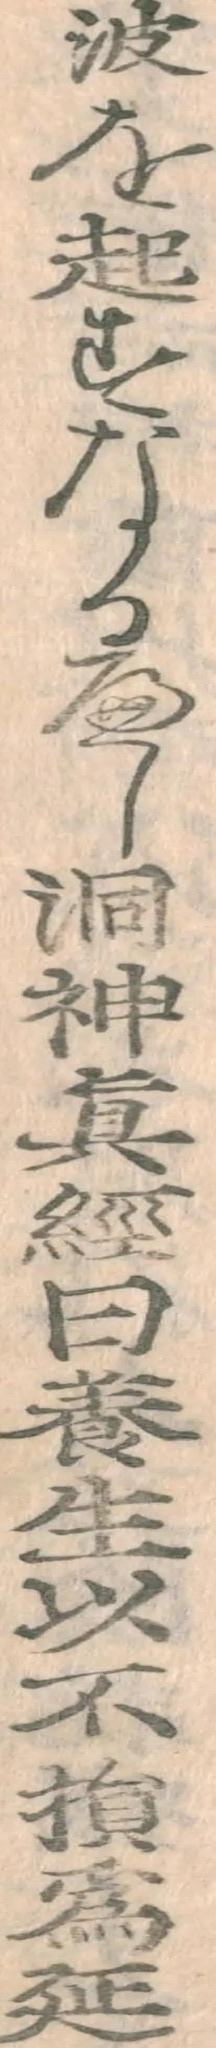波を起すなるへし洞神真経曰養生以不損為延

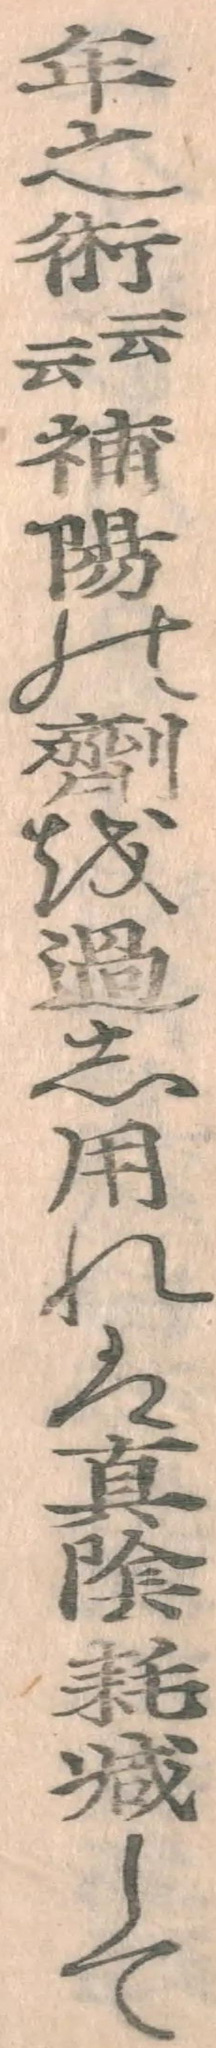年の術云云補陽の剤を過し用れは真陰耗減して
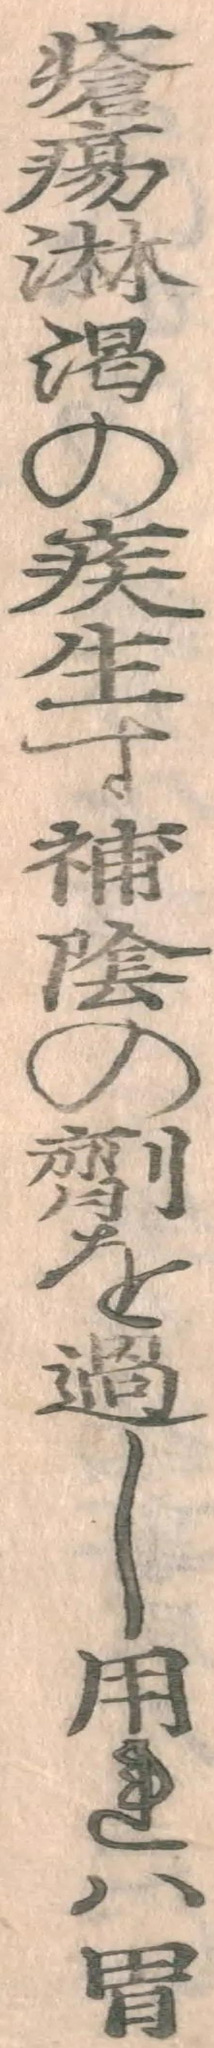瘡痬淋渇の疾生す補陰の剤を過し用れは胃
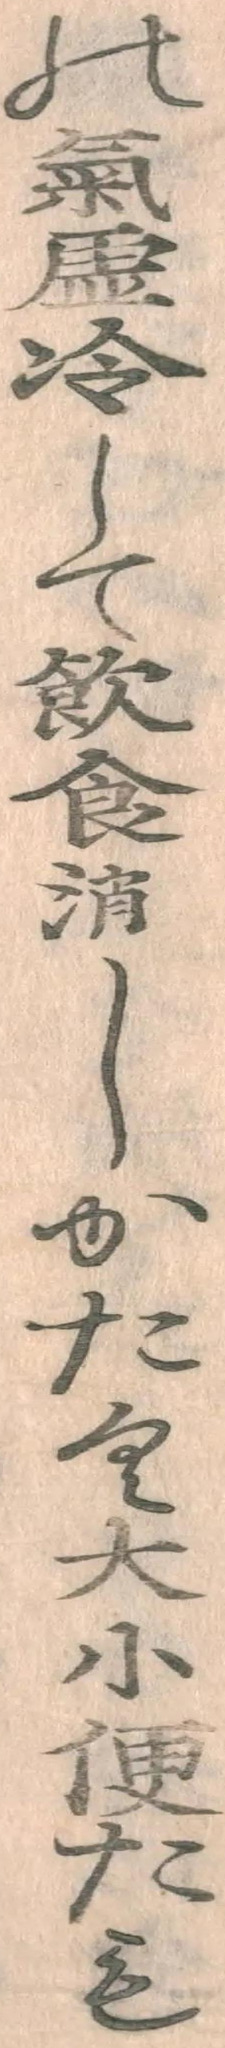の気虚冷して飲食消しかたく大小便たも
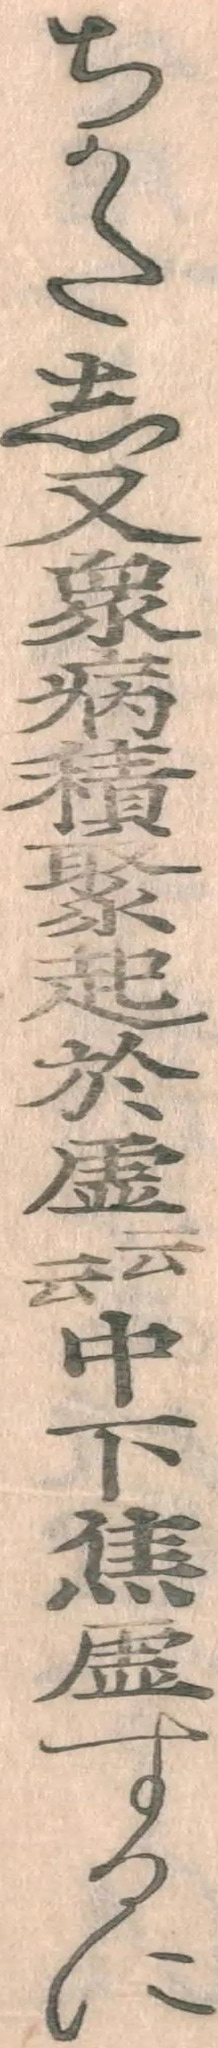ちかたし又衆病積聚起於虚云云中下焦虚するに
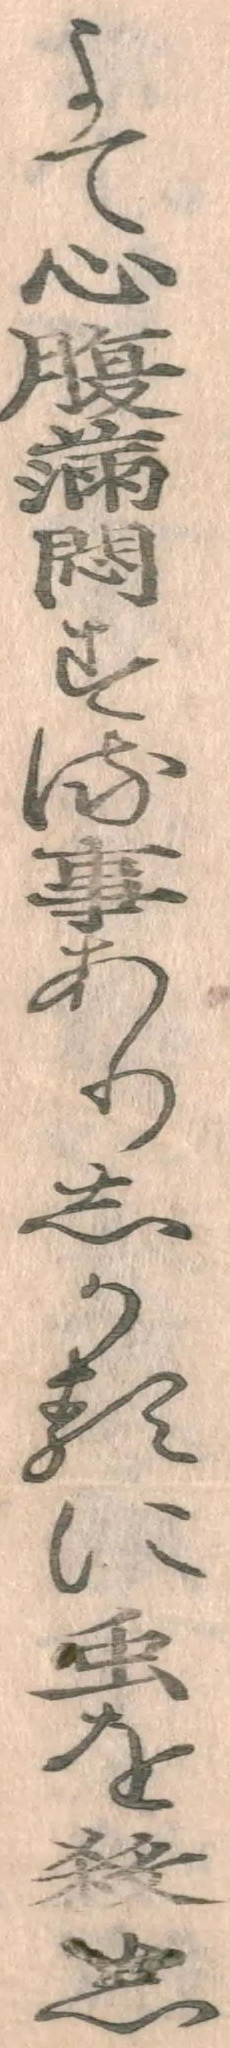よて心腹満悶する事ありしかるに虫を殺し
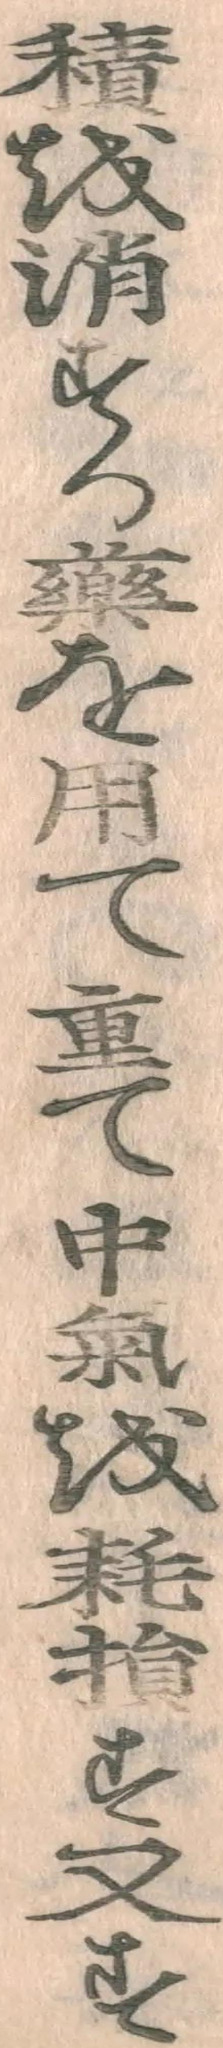積を消する薬を用て重て中気を耗損す又す
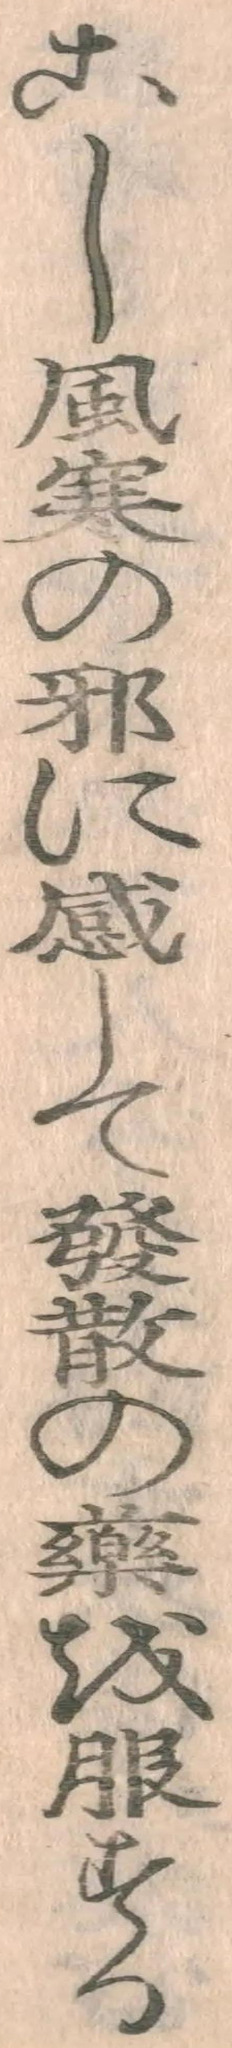こし風寒の邪に感して発散の薬を服する
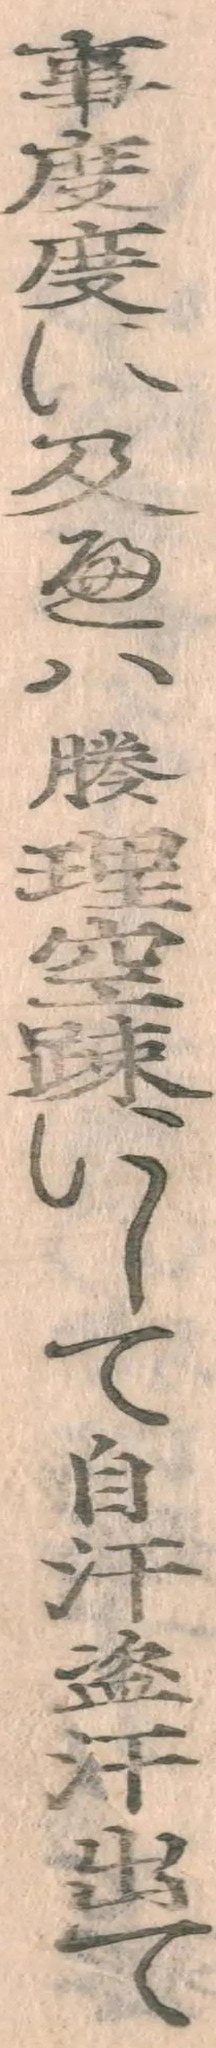事度度に及へは腠理空疎にして自汗盗汗出て
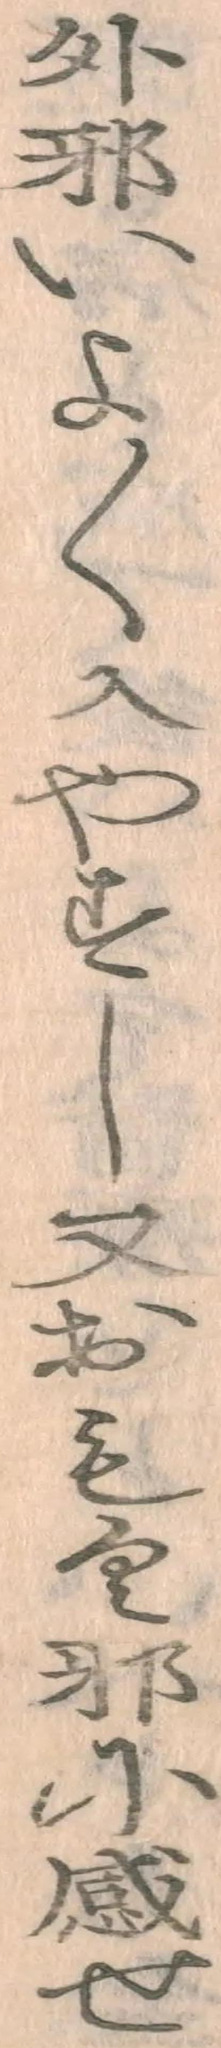外邪いよ〳〵入やすし又おもく邪に感せ
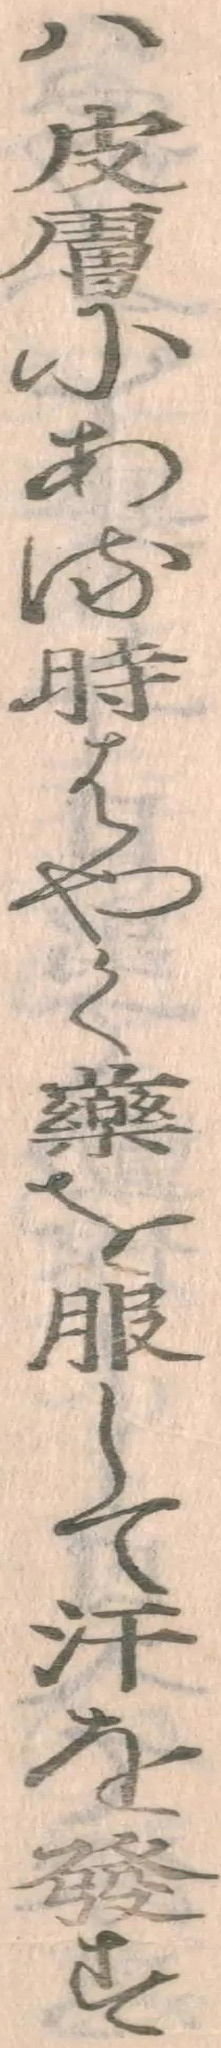は皮膚にある時はやく薬を服して汗を発す
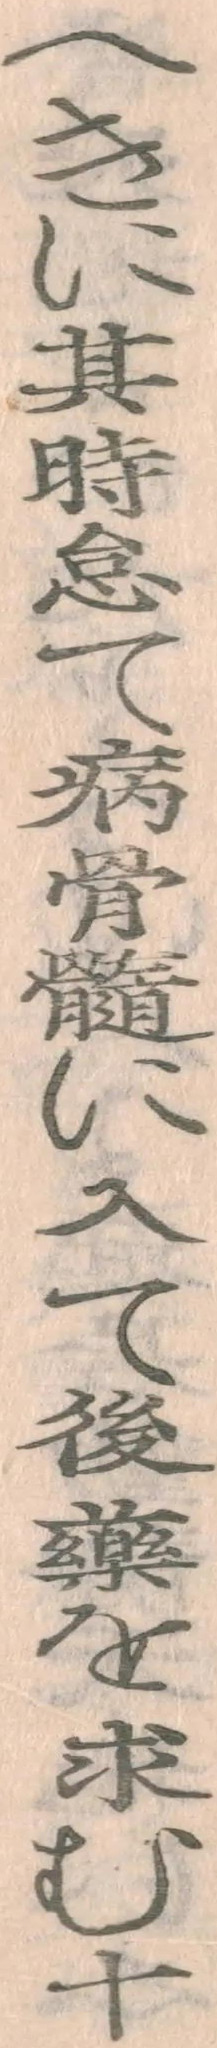へきに其時怠て病骨髄に入て後薬を求む十
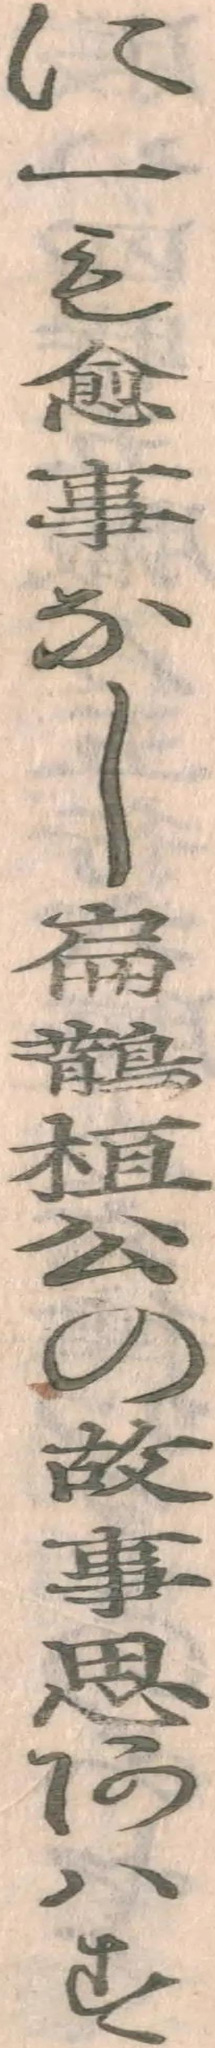に一も愈事なし扁鵲桓公の故事思あはす
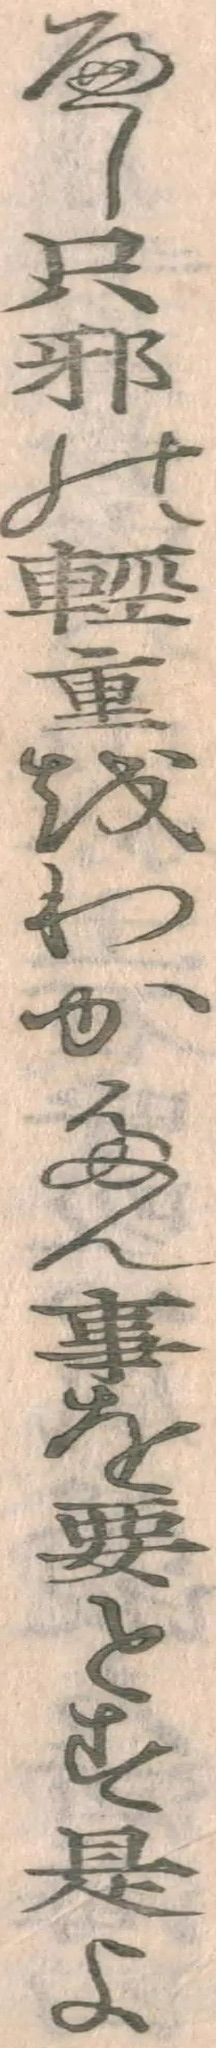へし只邪の軽重をわかたん事を要とす是よ
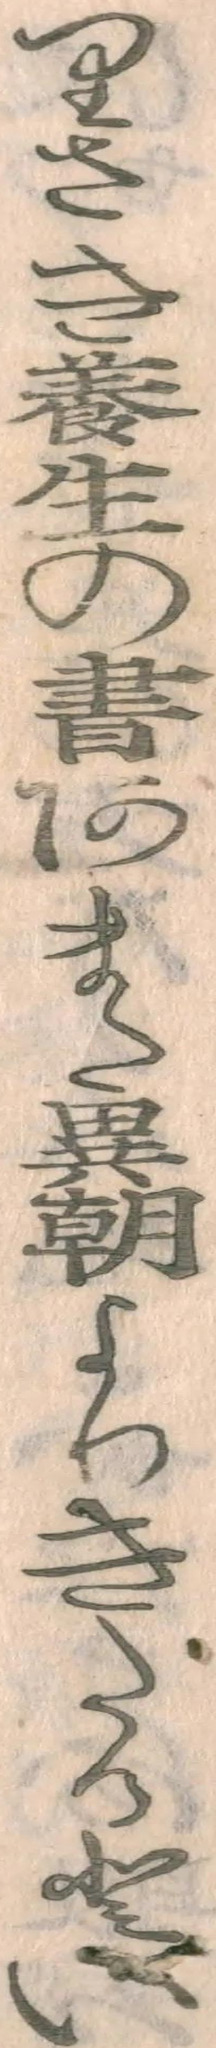りさき養生の書あまた異朝よりきたるとい
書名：延壽撮要
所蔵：国立国会図書館 National Diet Library, JAPAN
